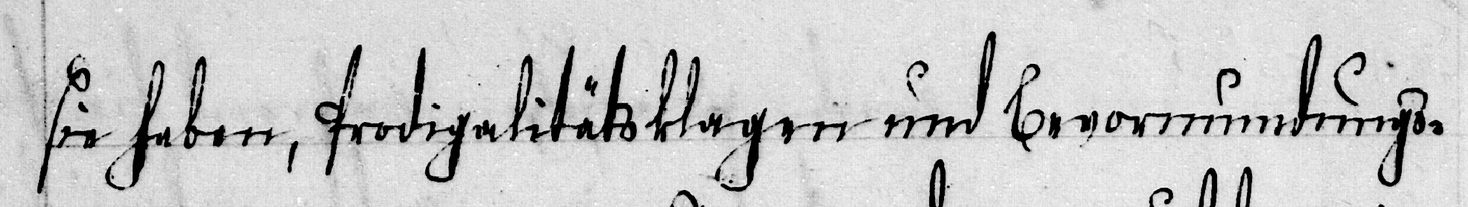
sie haben, Prodigalitätsklagen und Bevormundungs¬
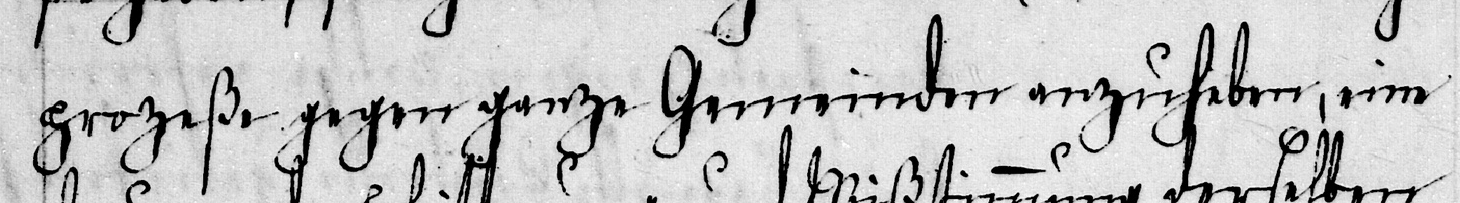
prozeße gegen ganze Gemeinden anzuheben, eine
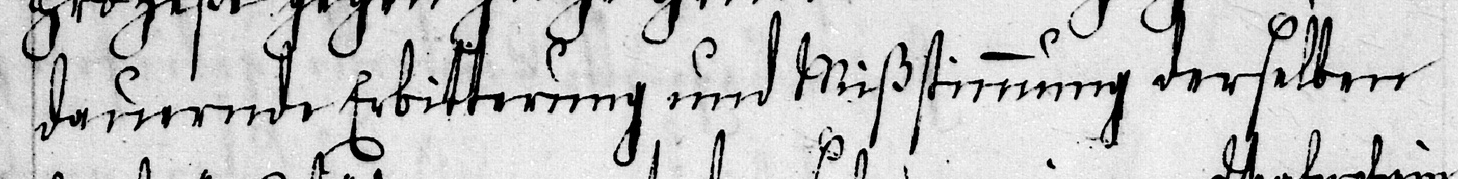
dauernde Erbitterung und Mißstimmung derselben
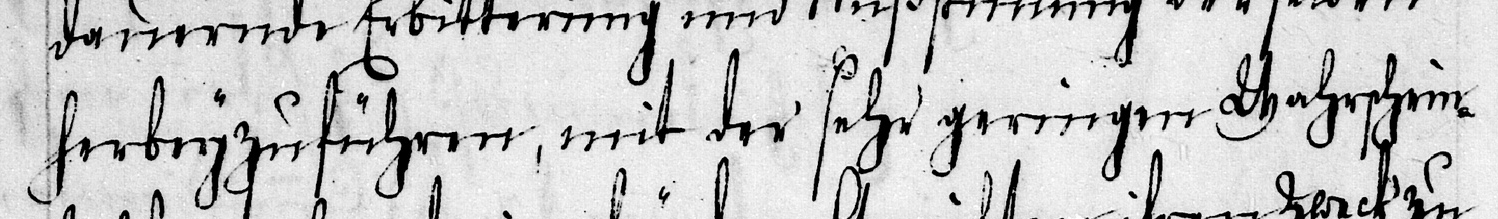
herbeyzuführen, mit der sehr geringen Wahrschein¬
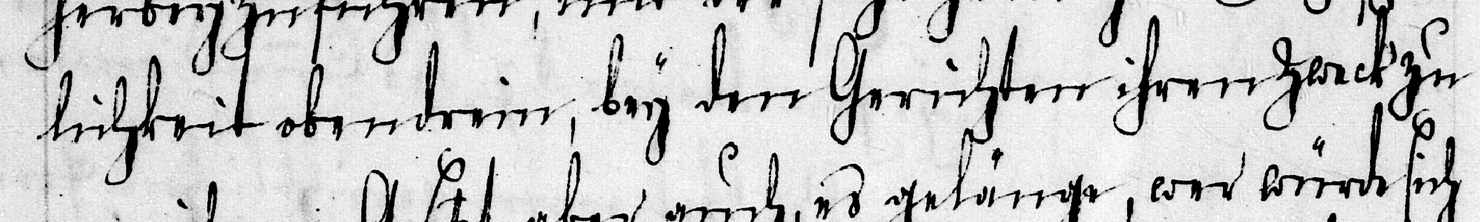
lichkeit obendrein, bey den Gerichten ihren Zweck zu
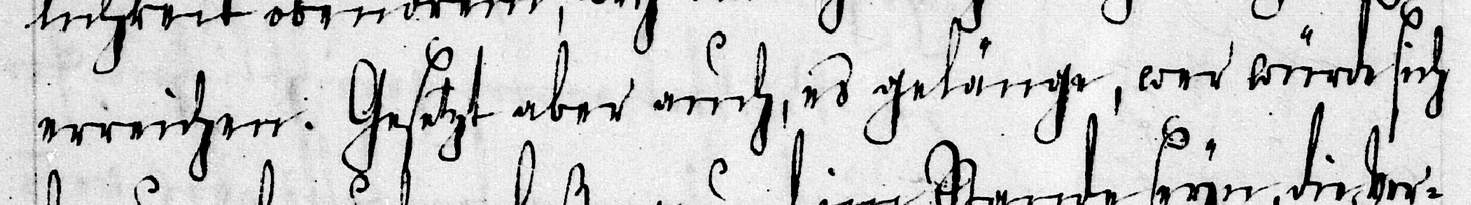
erreichen. Gesetzt aber auch, es gelänge, wer würde sich
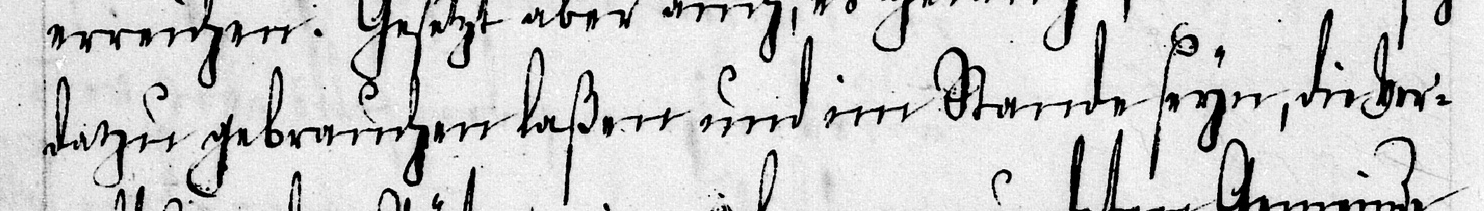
dazu gebrauchen laßen und im Stande seyn, die Ver¬
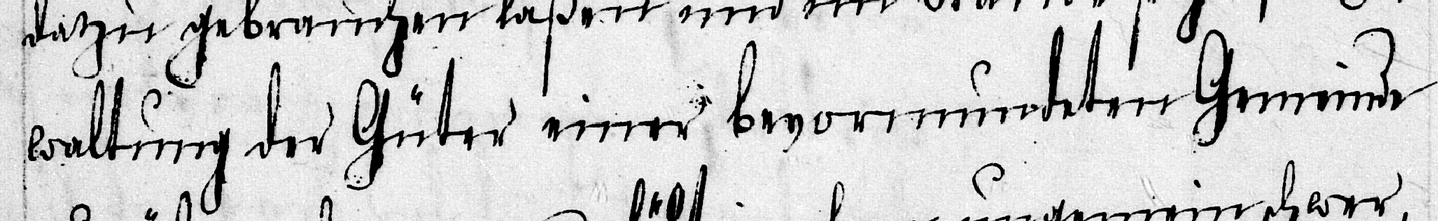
waltung der Güter einer bevormundeten Gemeinde
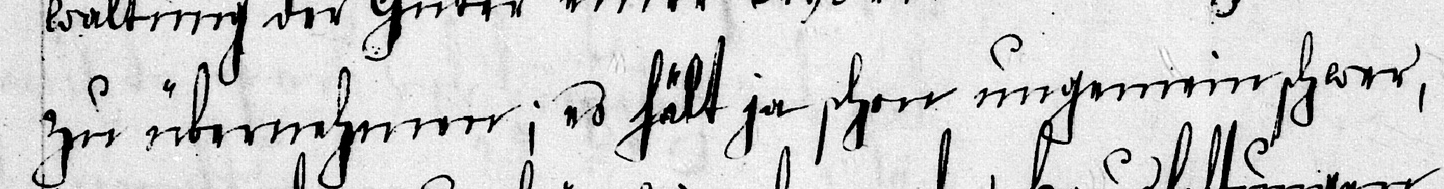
zu übernehmen; es fällt ja schon ungemein schwer,
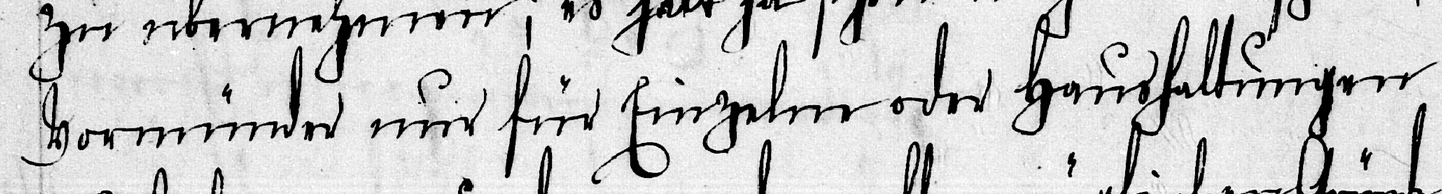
Vormünder nur für Einzelne oder Haushaltungen
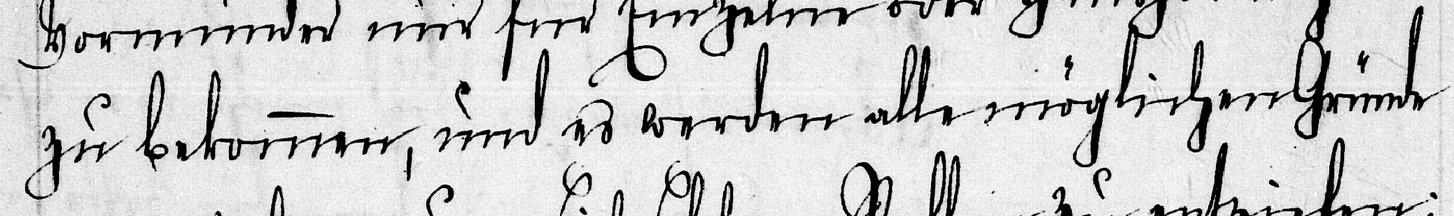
zu bekommen, und es werden alle möglichen Gründe
